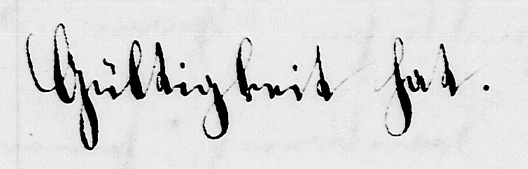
Gültigkeit hat.
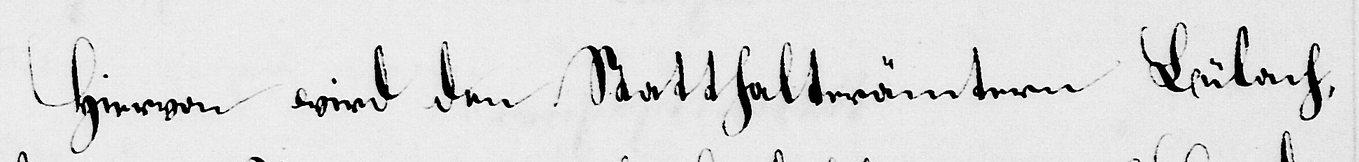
Hiervon wird den Statthalterämtern Bülach,
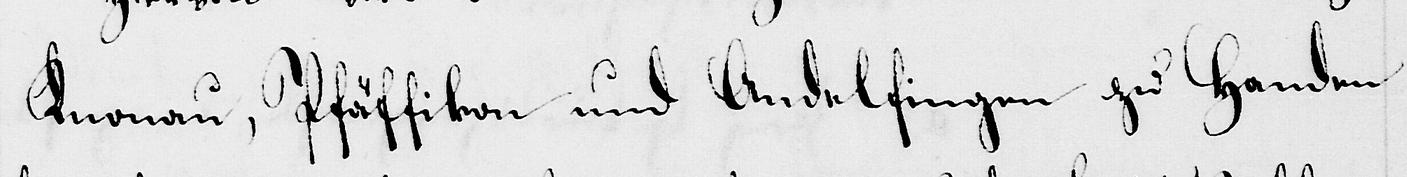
Knonau, Pfäffikon und Andelfingen zu Handen
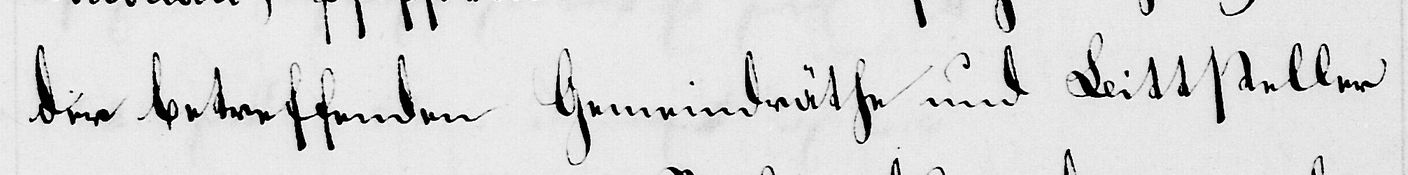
der betreffenden Gemeindräthe und Bittsteller
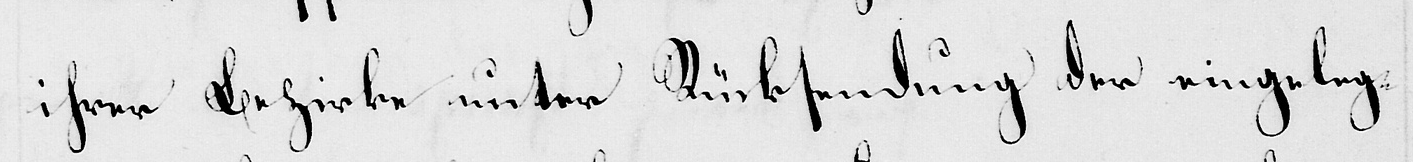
ihrer Bezirke unter Rücksendung der eingeleg¬
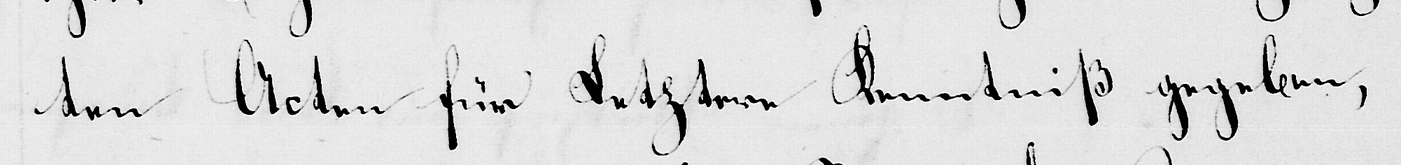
ten Acten für Letztere Kenntniß gegeben,
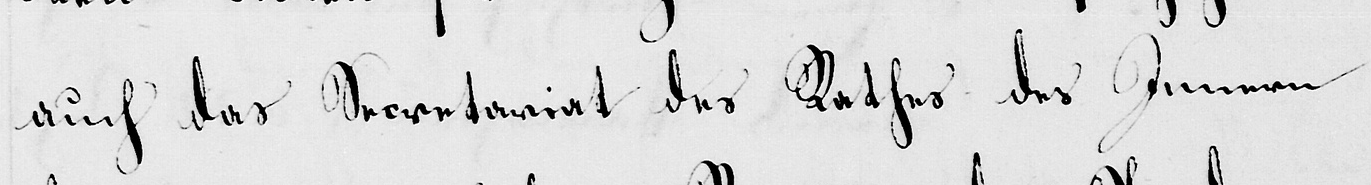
auch das Secretariat des Rathes des Innern
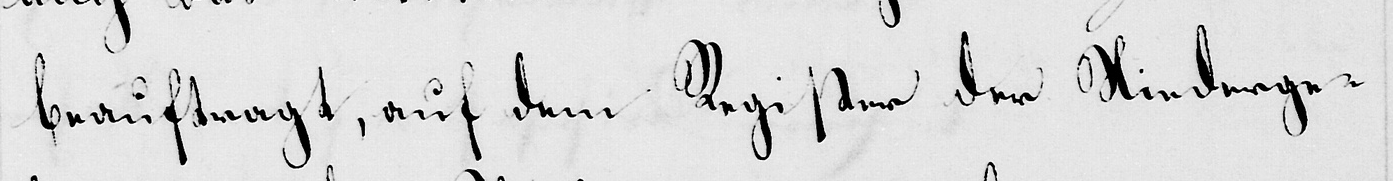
beauftragt, auf dem Register der Niederge¬
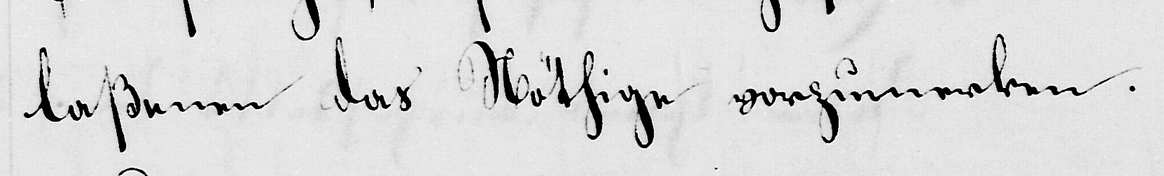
laßenen das Nöthige vorzumerken.
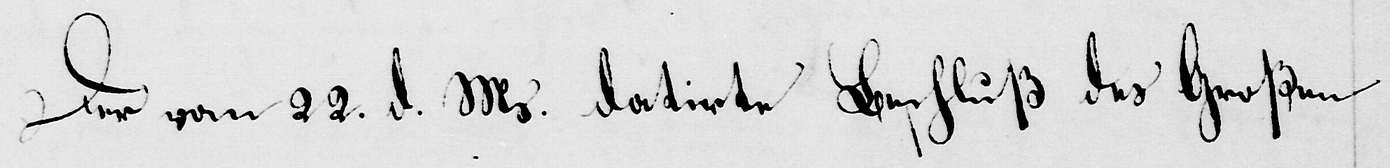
Der vom 22 .d. Ms. datirte Beschluß des Großen
